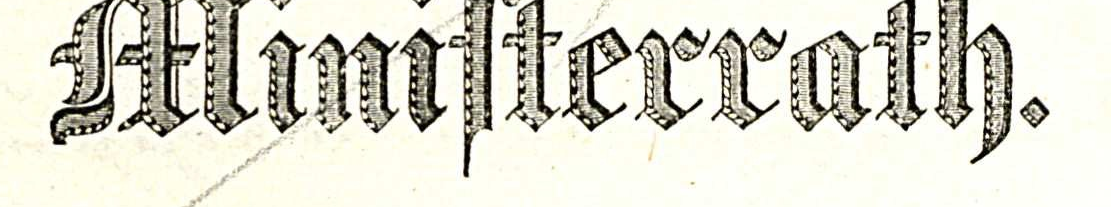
Ministerrath
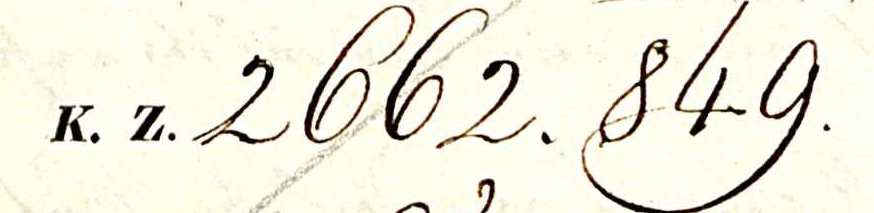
KZ 2662 849
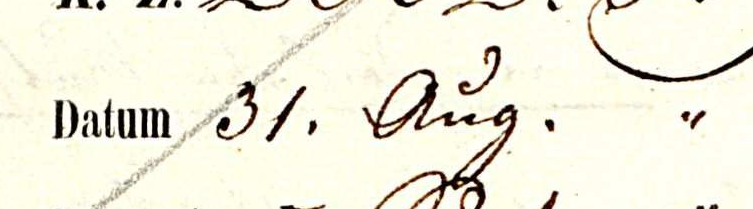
Datum 31. Aug. 1849
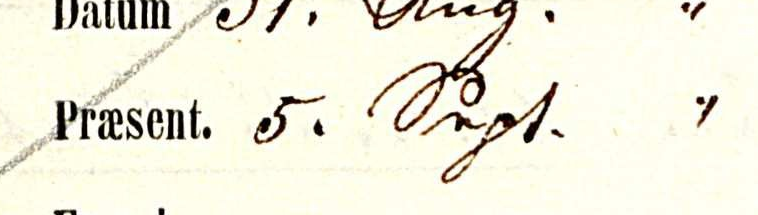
Praesent 5. Sept. 849
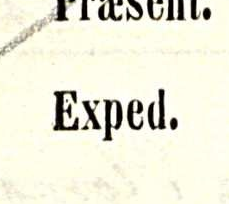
Exped.
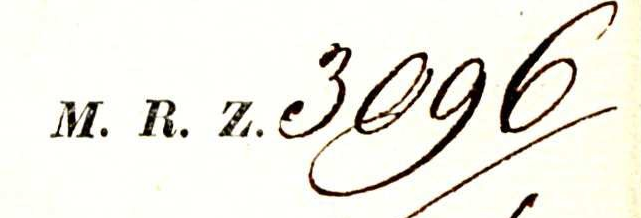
MRZ 3096
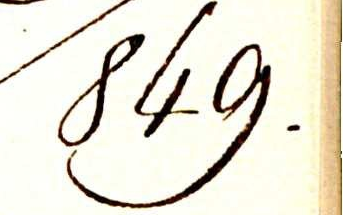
849
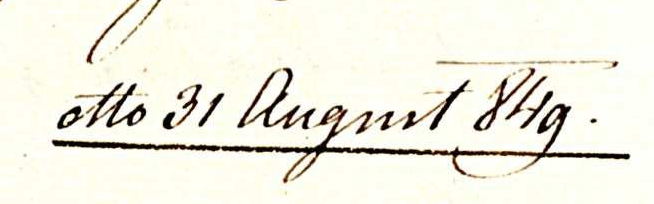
dto. 31 August 1849
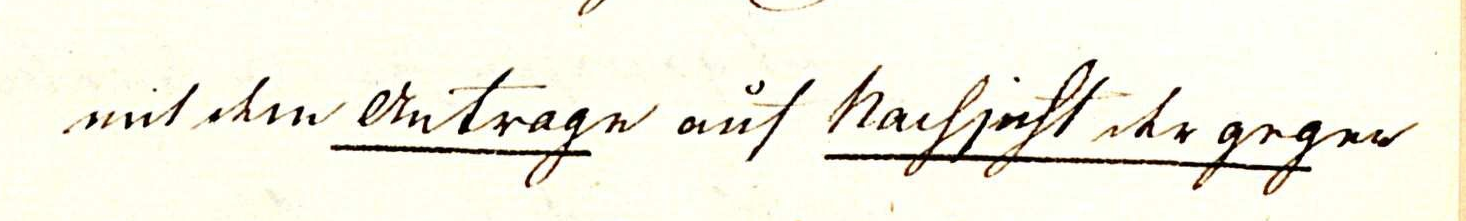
mit dem Antrage auf Nachsicht der gegen
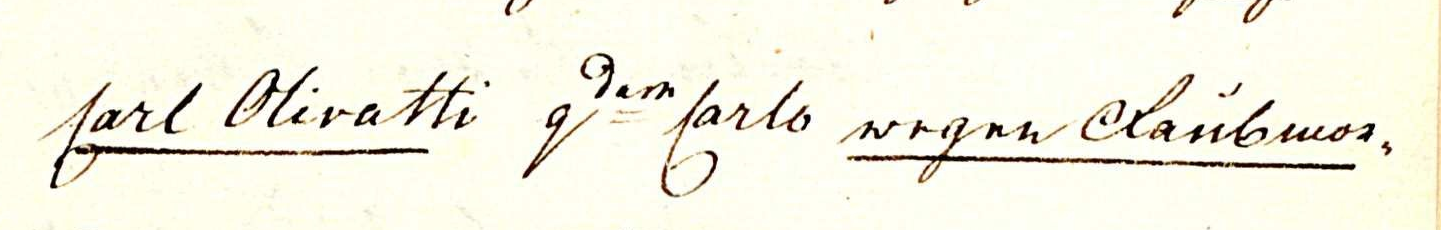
Carl Olivatti qdam Carlo wegen Raubmor¬
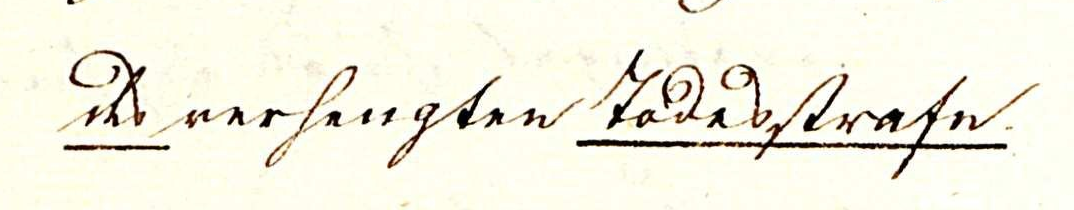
des verhengten Todesstrafe.
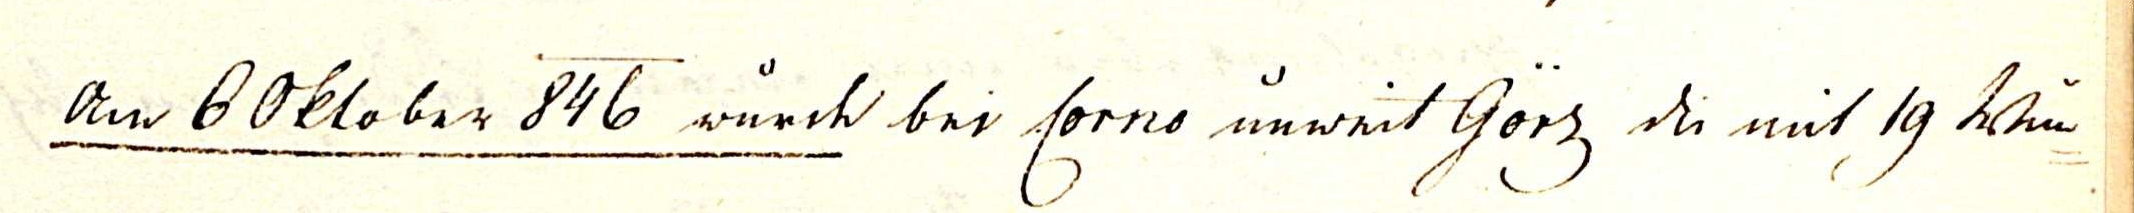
Am 6 Oktober 846 wurde bei Forno unweit Görz die mit 19 Stun¬
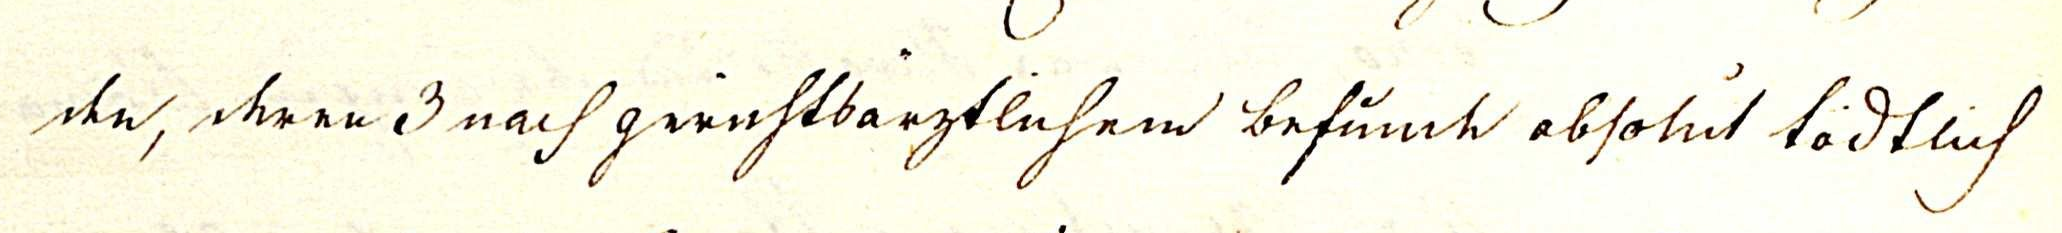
den, deren 3 nach gerichtsärztlichem Befunde absolut tödtlich
